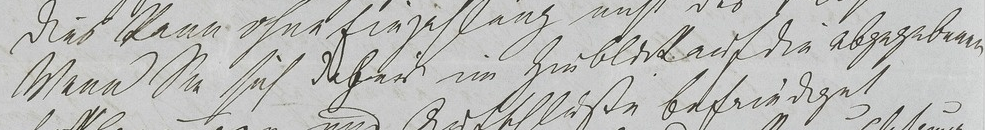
Wenn Sie sich daher im Hinblick auf die abgegebenen
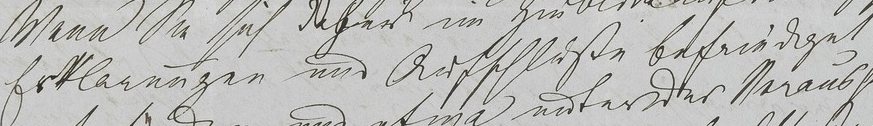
Erklärungen und Aufschlüße befriediget
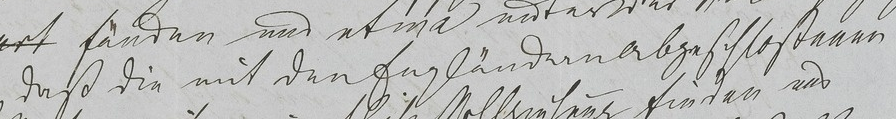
«daß die mit den Engländern abgeschloßenen
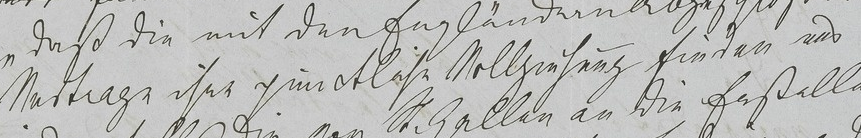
Verträge ihre pünctliche Vollziehung finden und
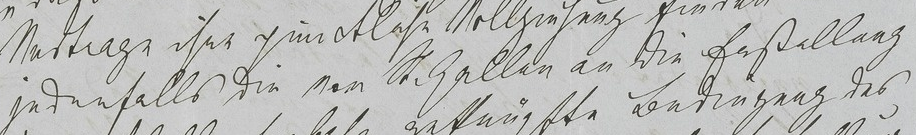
jedenfalls die von St. Gallen an die Erstellung
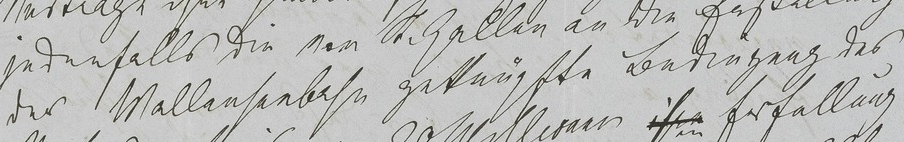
der Wallenseebahn geknüpfte Bedingung des
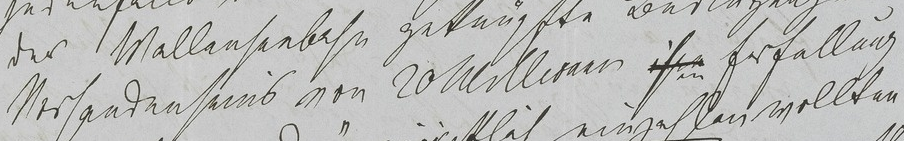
Vorhandenseins von 20 Millionen ihrein Erfüllung
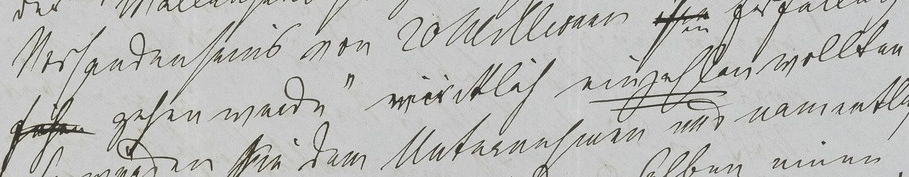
sehen gehen werde» wircklich einzahlen wollten,
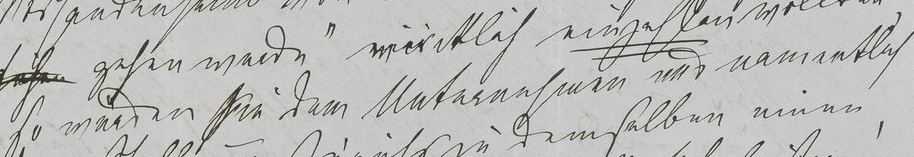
so würden Sie dem Unternehmen und namentlich
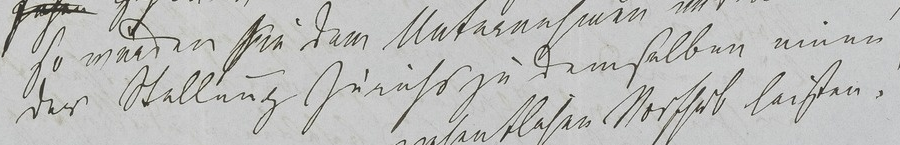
der Stellung Zürichs zu demselben einen
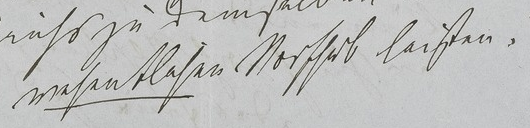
wesentlichen Vorschub leisten!
